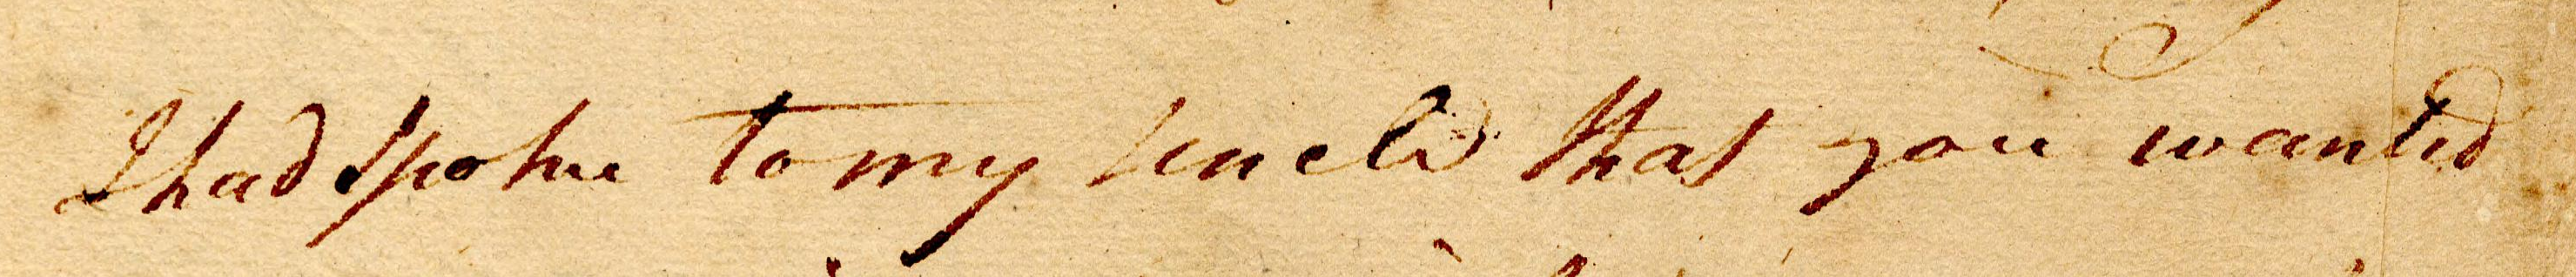I had spoke to my Seneh that you wanted
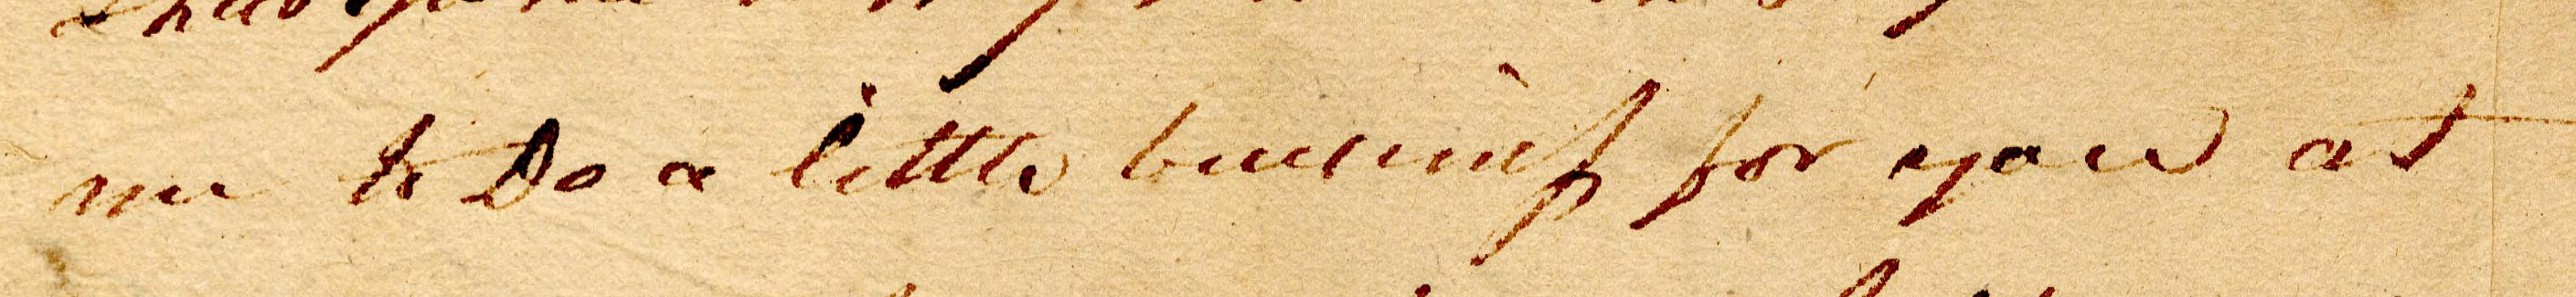me to do a little buisiness for you at
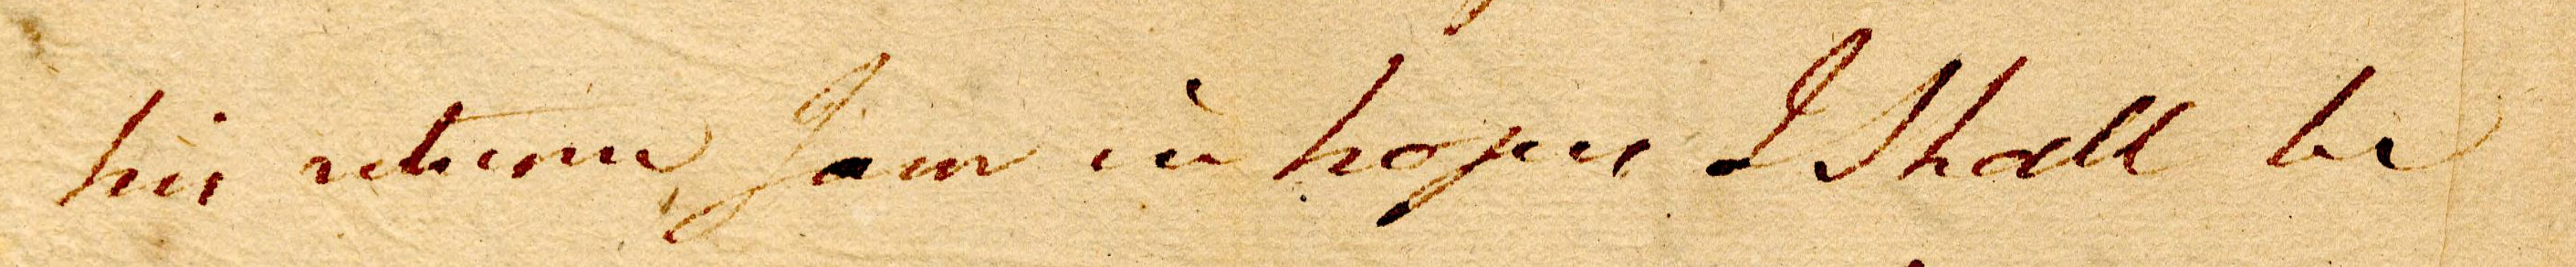his return, I am in hopes I shall be
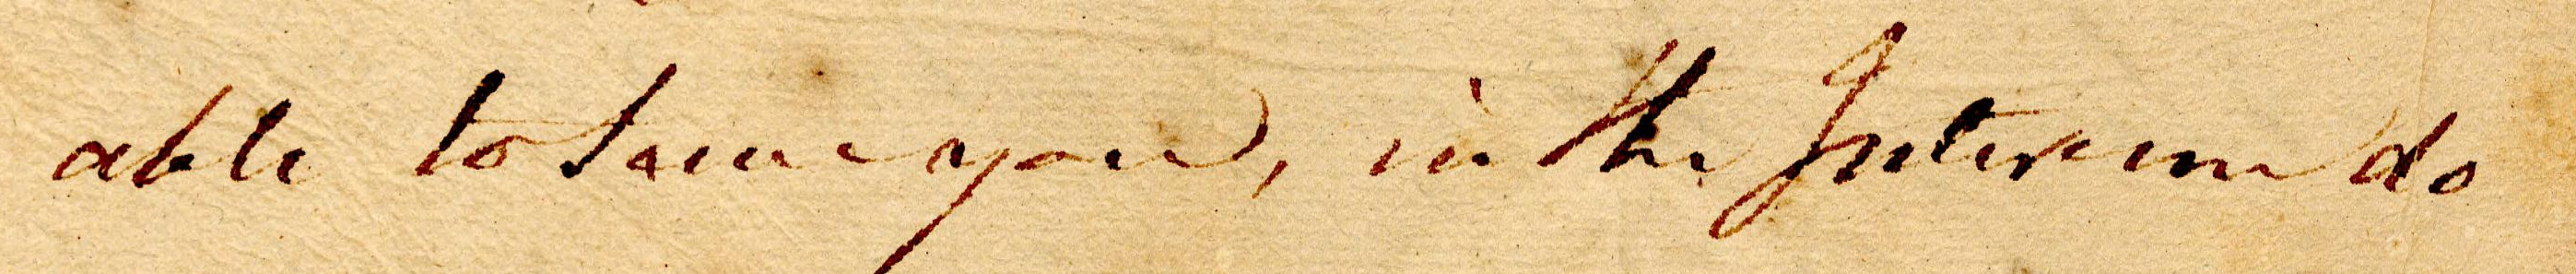able to serve you, in the Interim do
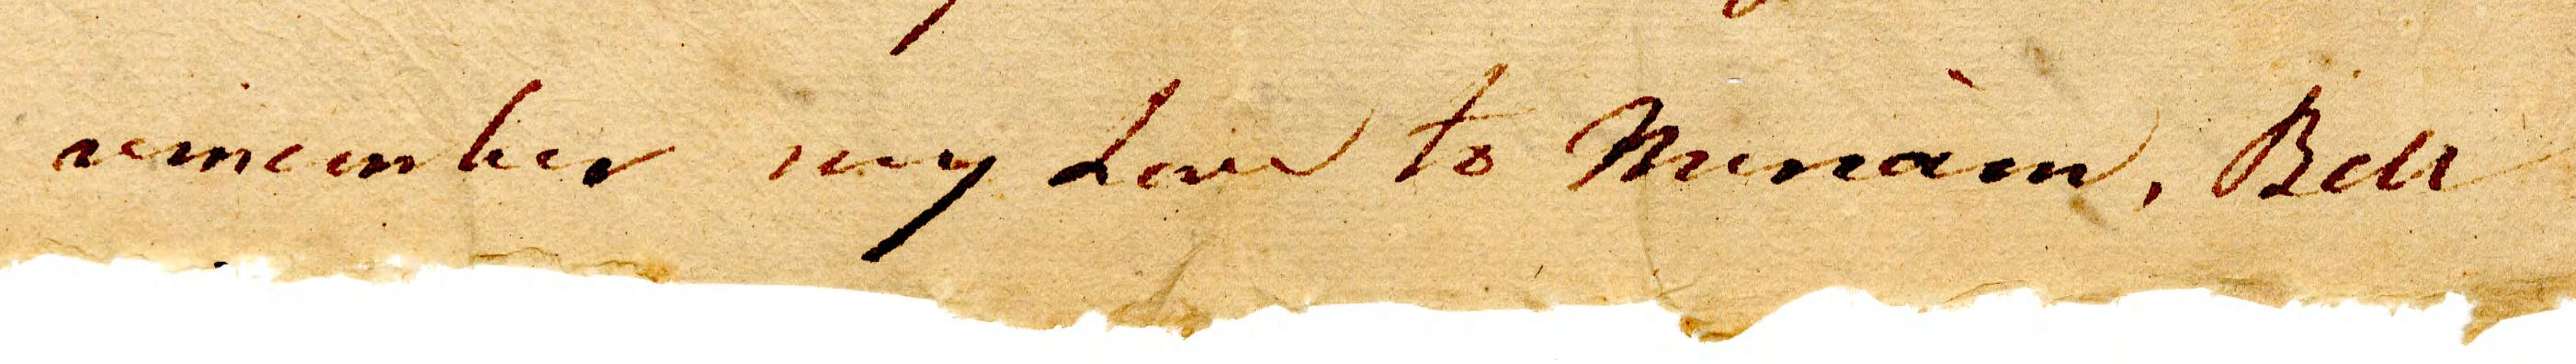remember my Love to Miriam, Bell
